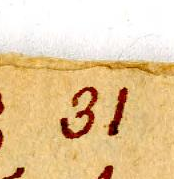31
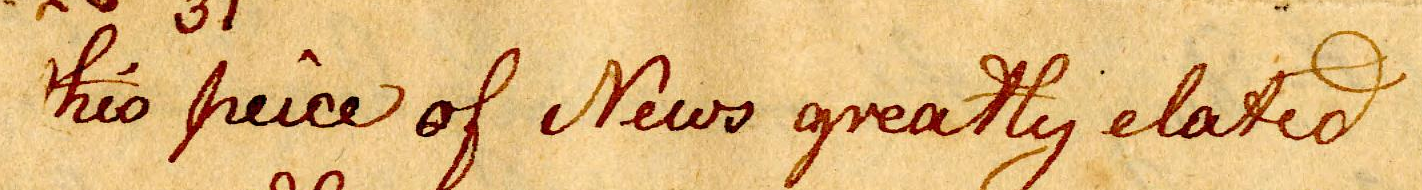this peice of News greatly elated
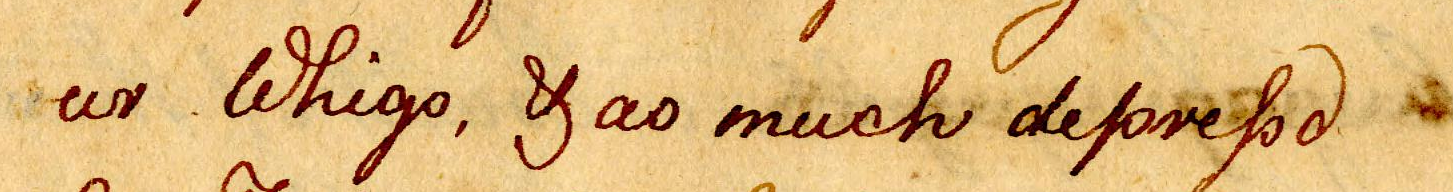us Whigs, & as much depressd
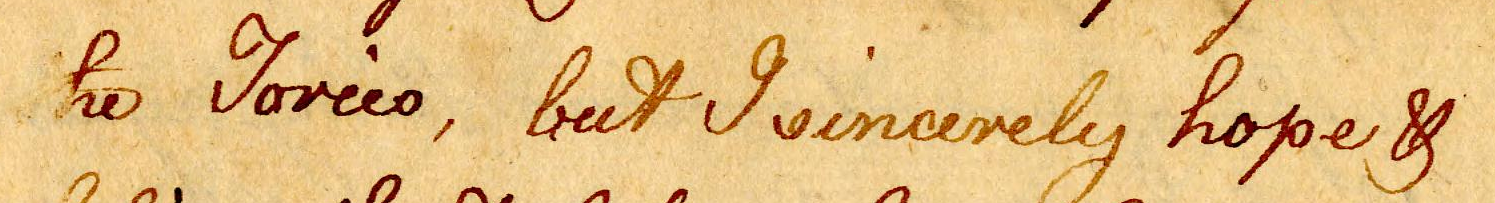the Tories, but I sincerely hope &
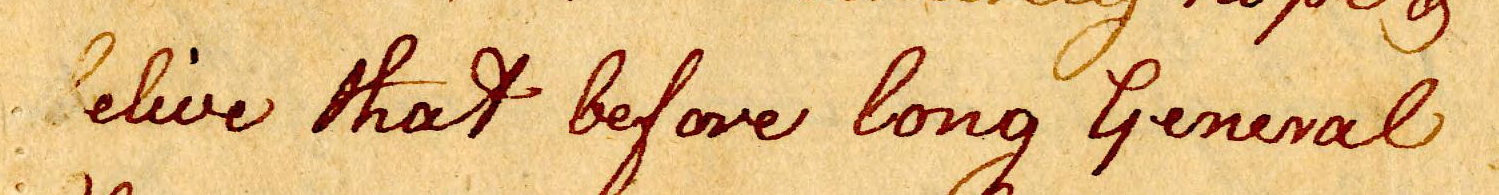belive that before long General
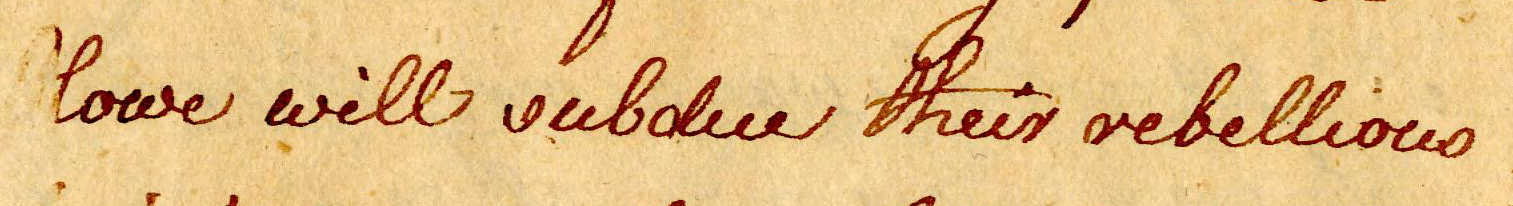Howe will subdue their rebellious
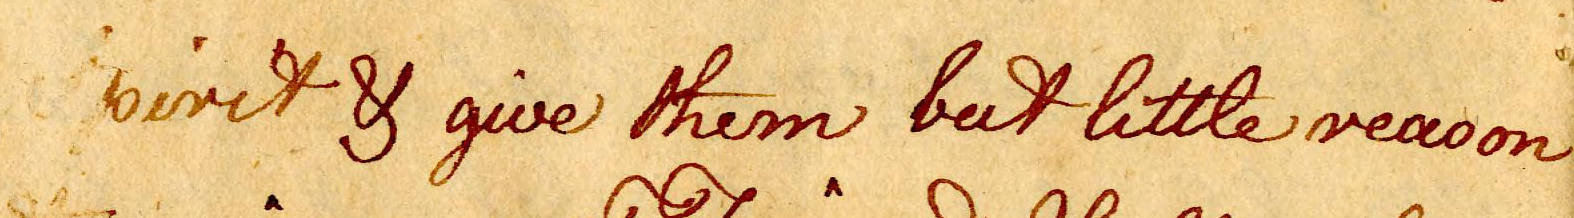Spirit & give them but little reason
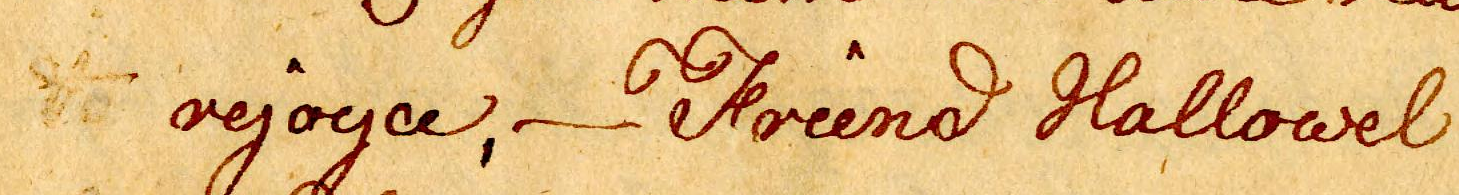to rejoyce,- Friend Hallowel
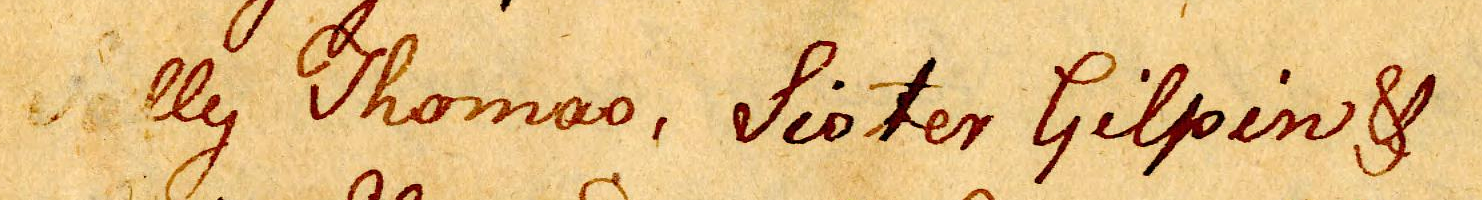Sally Thomas, Sister Gilpin &
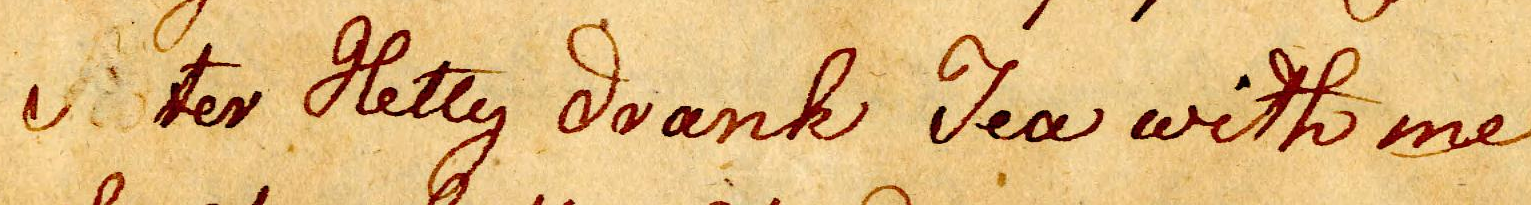Sister Hetty drank Tea with me
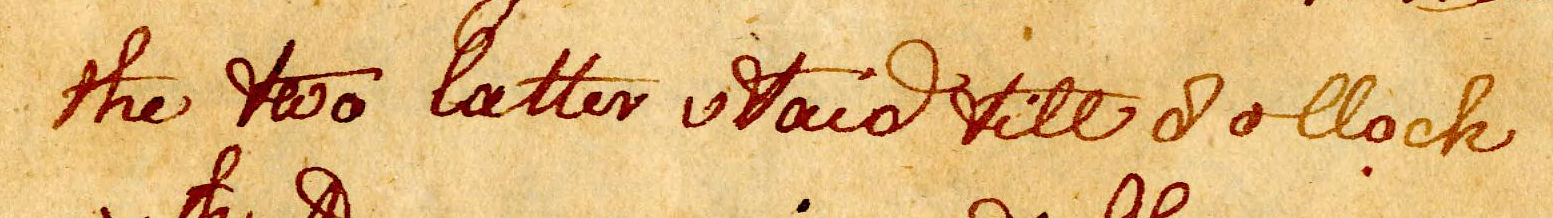the two latter staid till 8 oClock
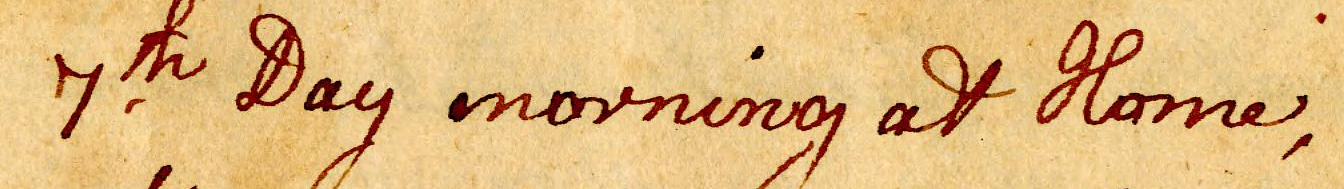7^th. Day morning at Home,
